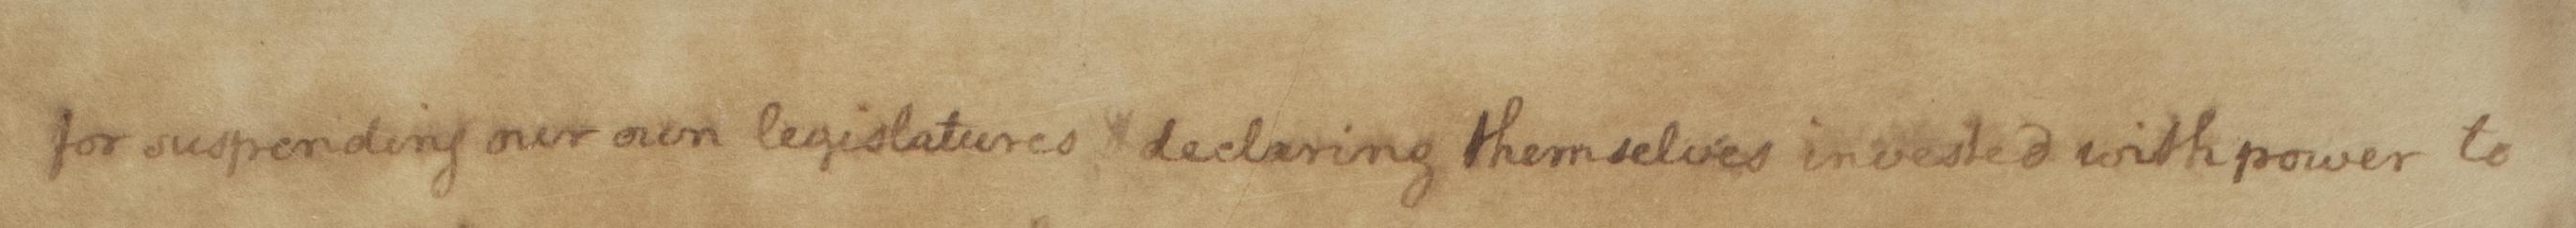for suspending our own legislatures declaring themselves invested with power to
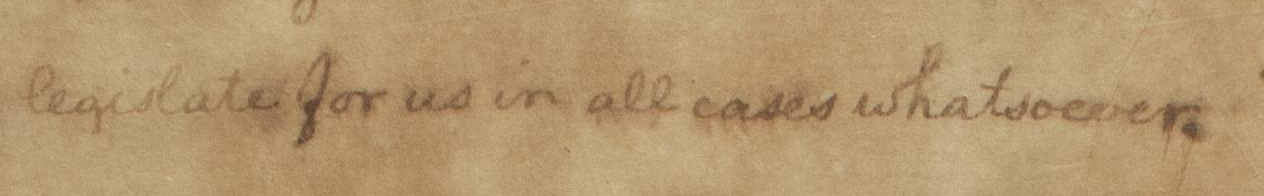legislate for us in all cases whatsoever
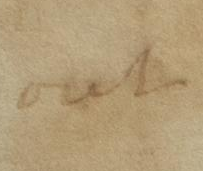out
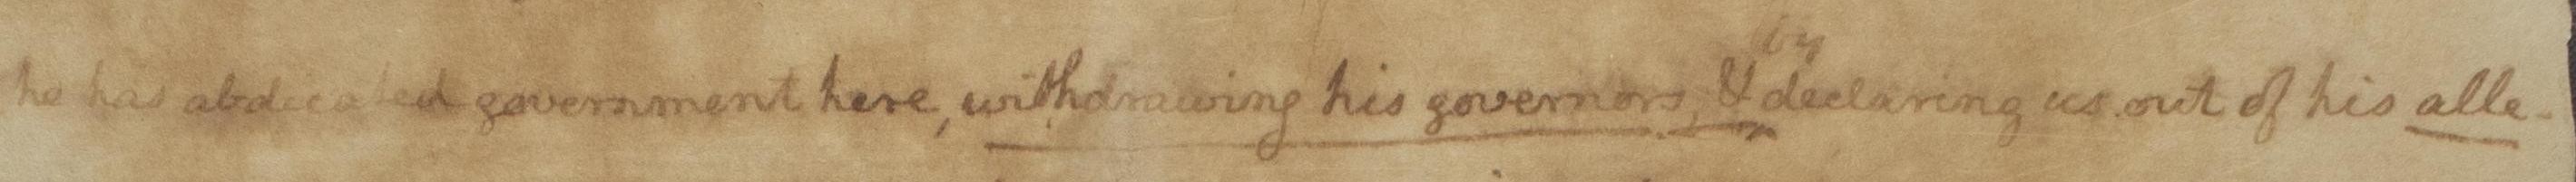he has abdicated it government here withdrawing his governors & ^by declaring us out of his alle-
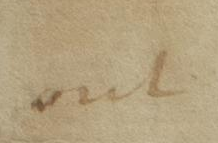out
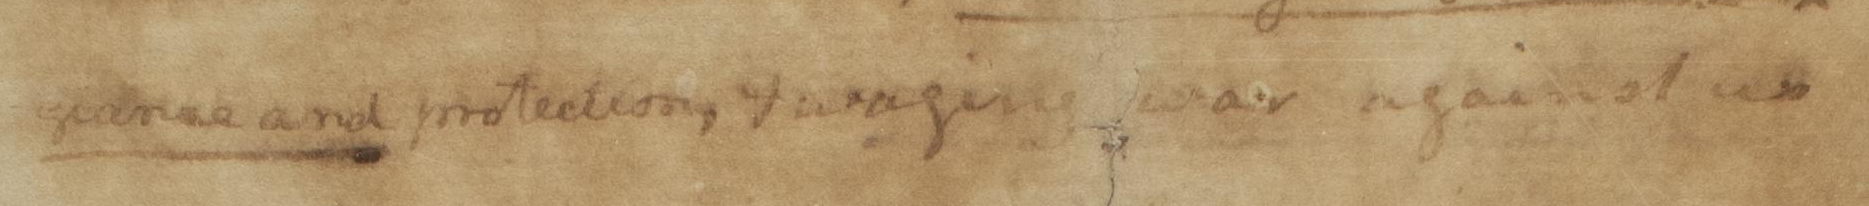-giance and protection & waging war against us
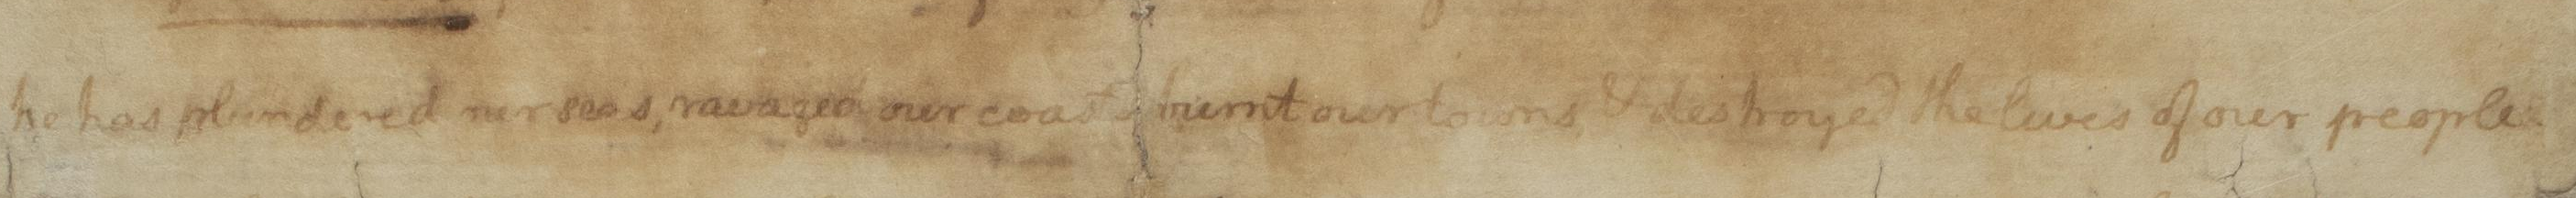he has plundered our season ravaged our coasts, burnt our towns & destroyed the lives of our people
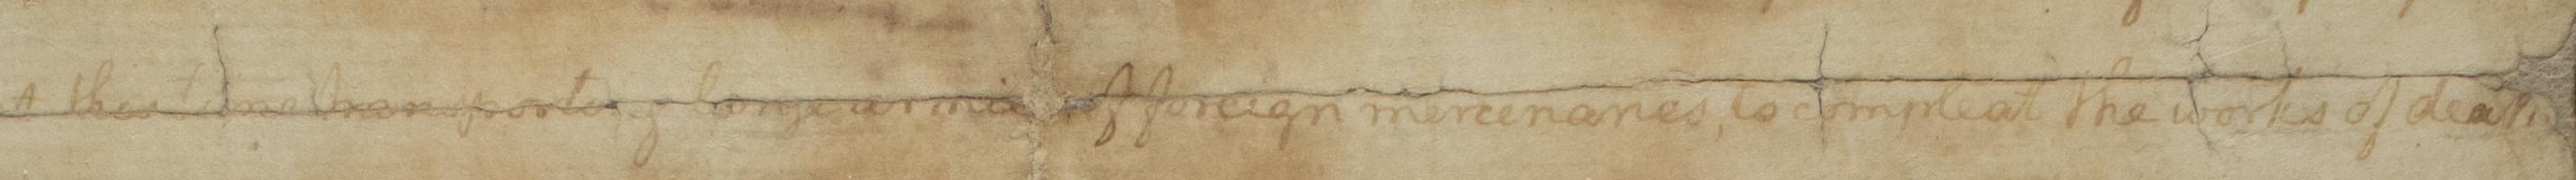At this time transporting large armies of foreign mercenaries to compleat the works of death
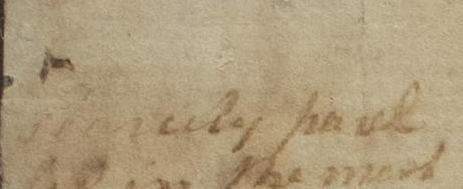scarcely parel
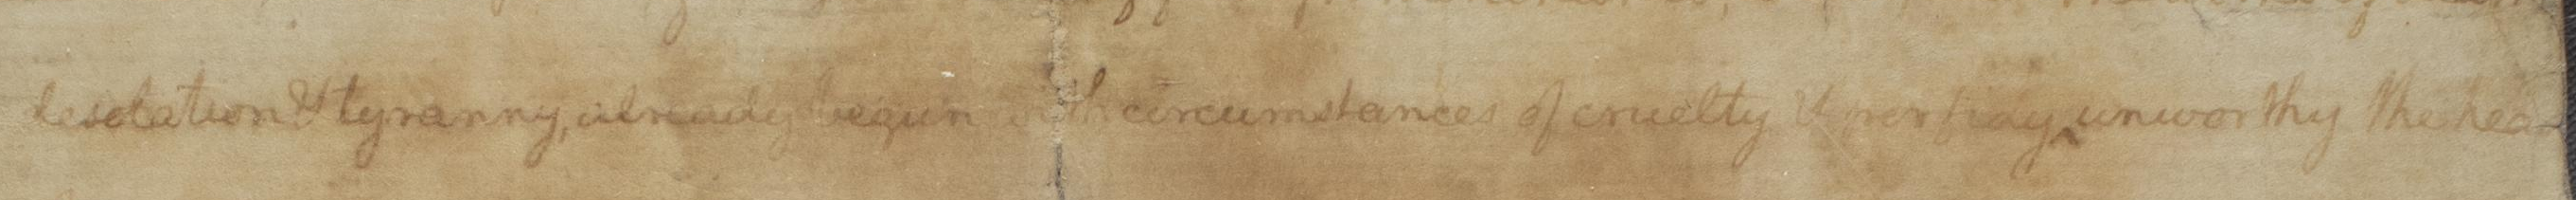destruction & tyranny, already begun with circumstances of cruelty & perfidy worthy the head
